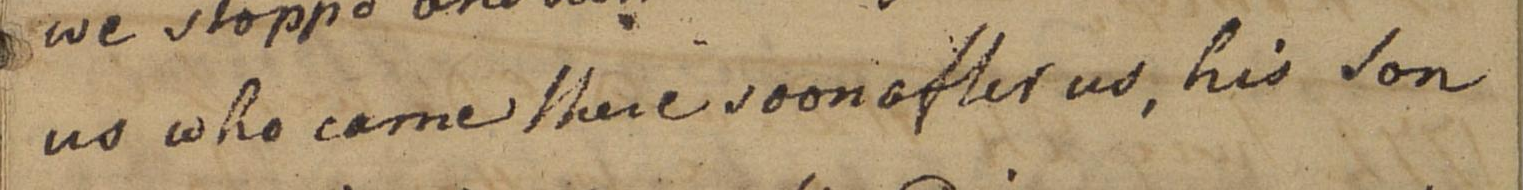us who came there soon after us, his son
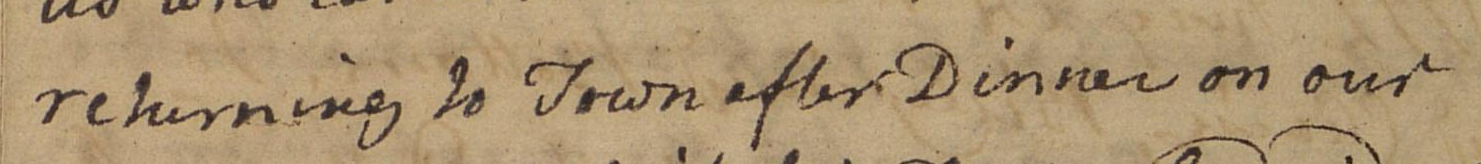returning to Town after Dinmr on our
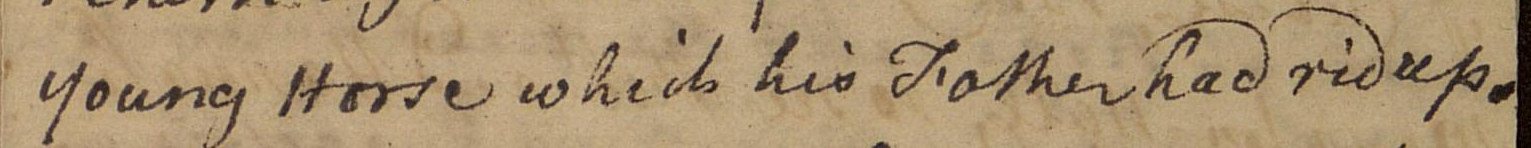young Horse which his Father had rid up,
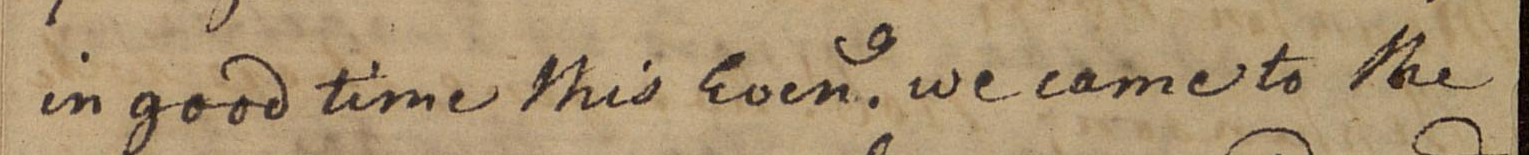in good time this Even^g. we came to the
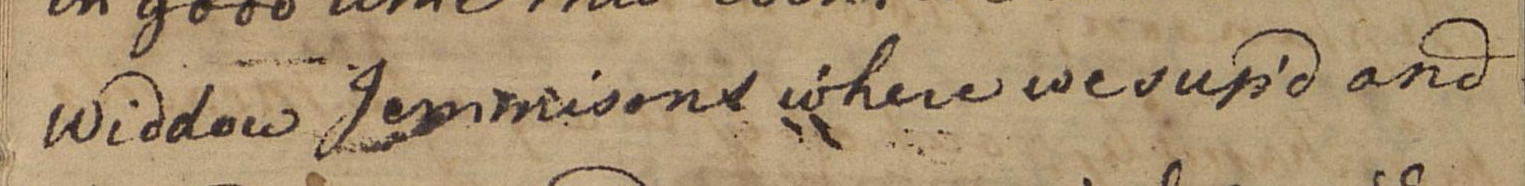Widdow Jemmisons where we sup'd and
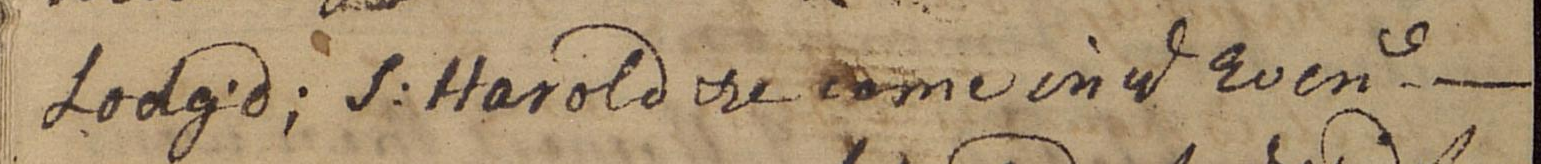Lodg'd; S: Harold to come in y^e Even^g--
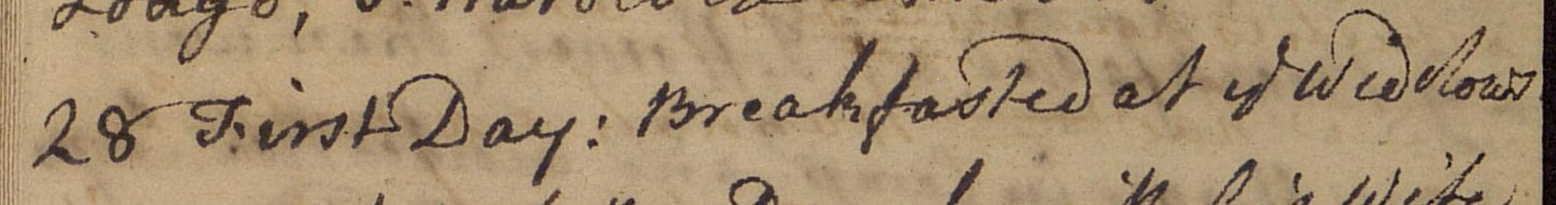28 First Day: Breakfasted at y^e Widdows
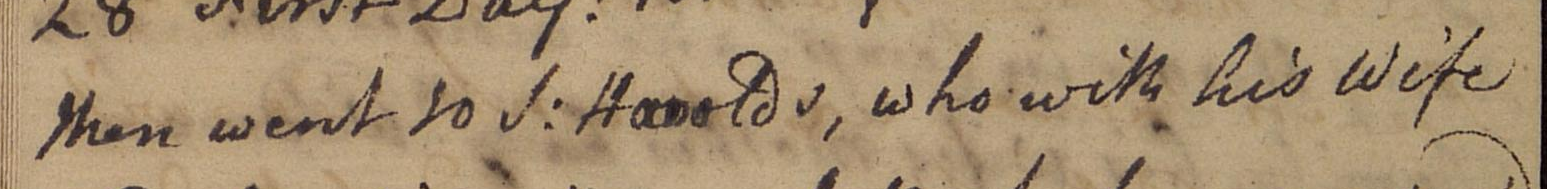then went to S: Harolds, who with his Wife
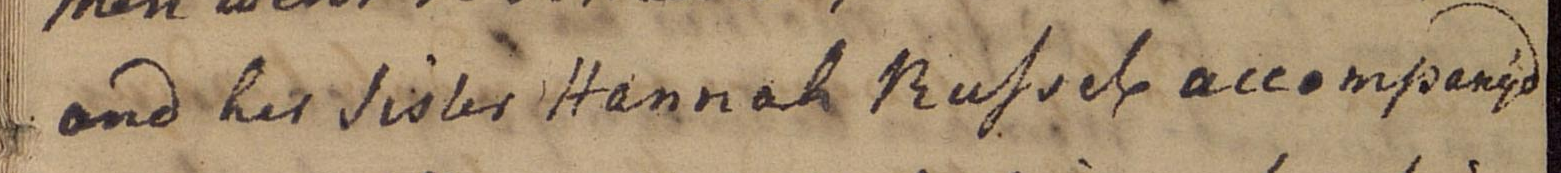and his Sister Hannah Russel accompany'd
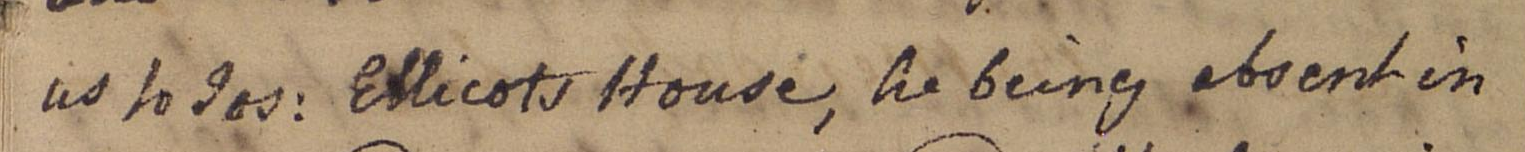us to Jos: Ellicots House, he being absent in
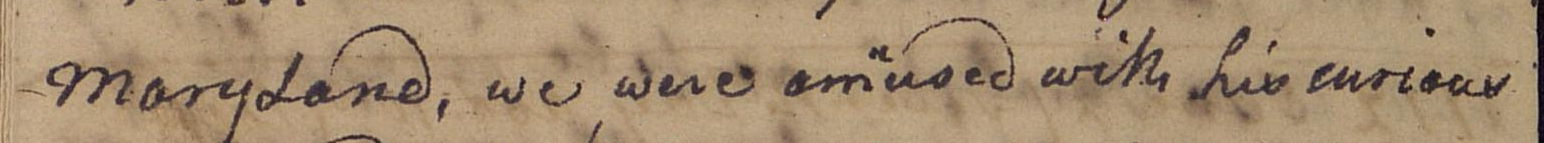Mary Land, we were amused with his curious
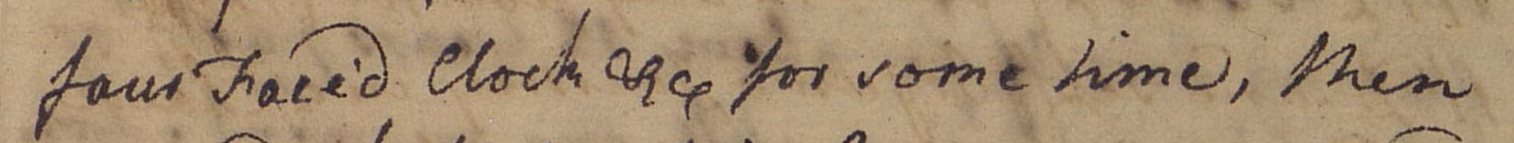Jaus? Face'd Clock &e for some time, then
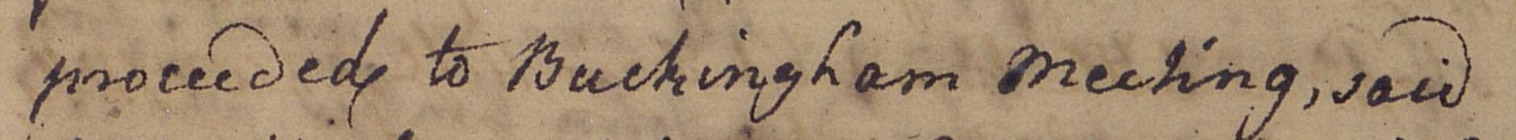proceeded to Buckingham meeting, said
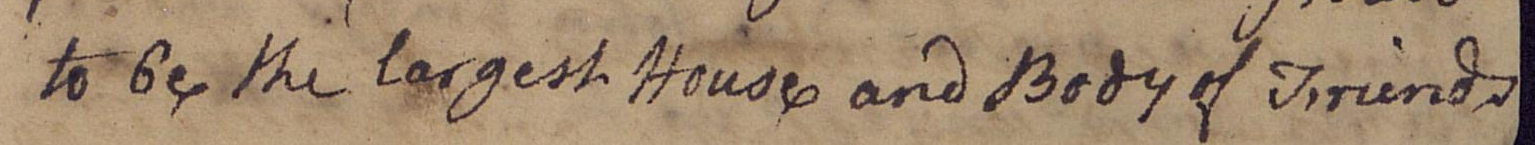to be the largest House and Body of Friends
